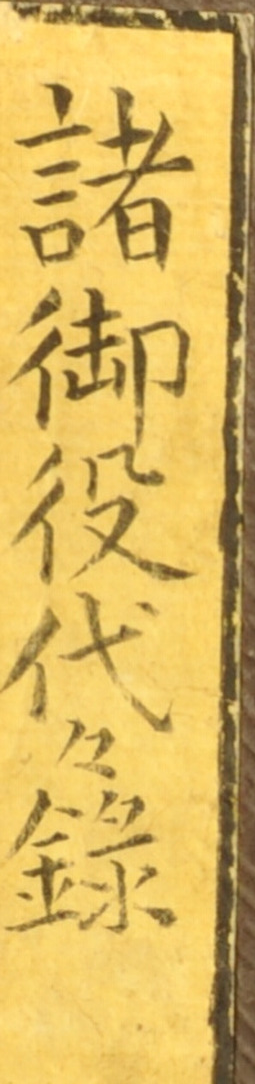諸御役代々録四

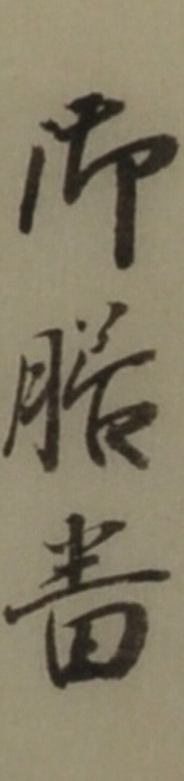御膳番
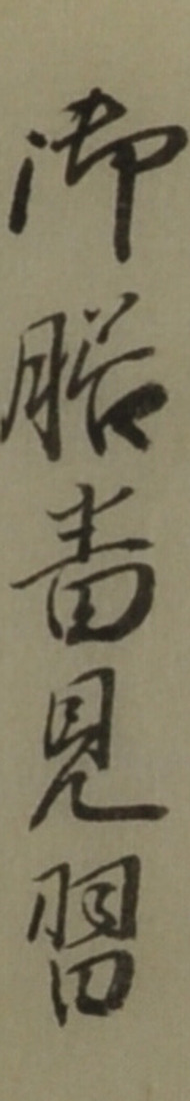御膳番見習
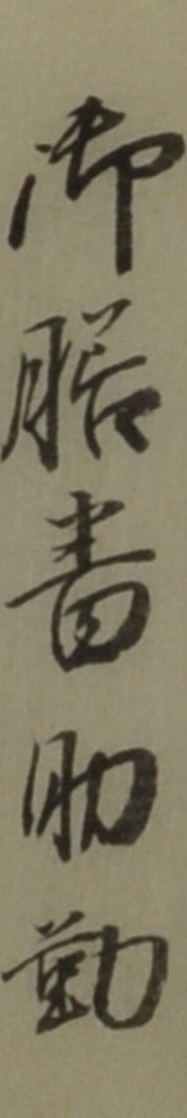御膳番助勤
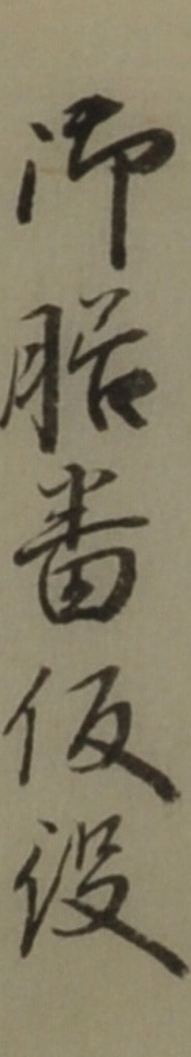御膳番仮役
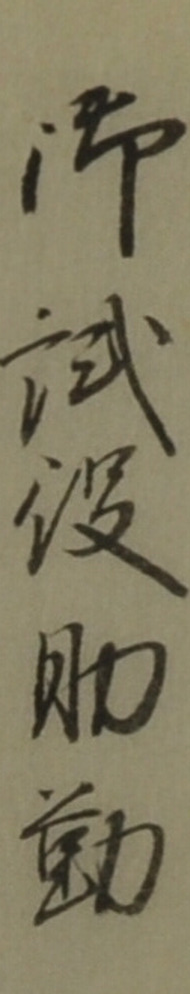御試役助勤
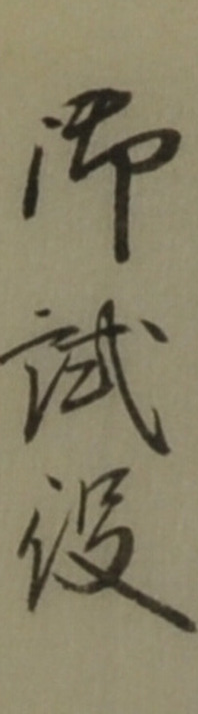御試役
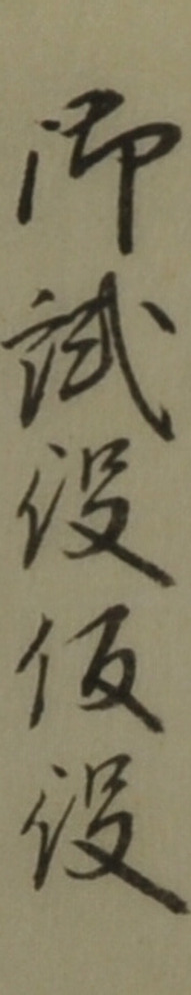御試役仮役
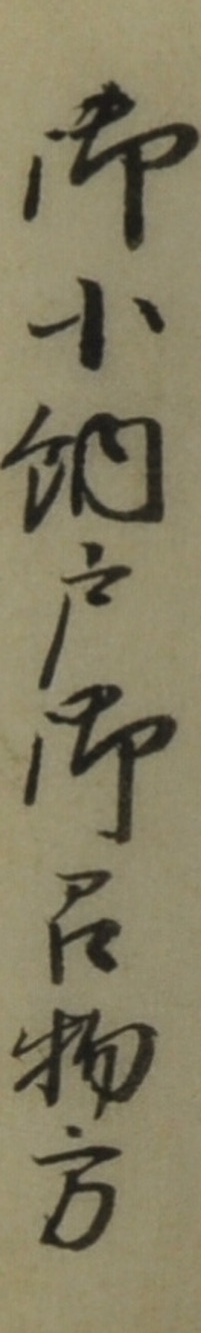御小納戸御召物方
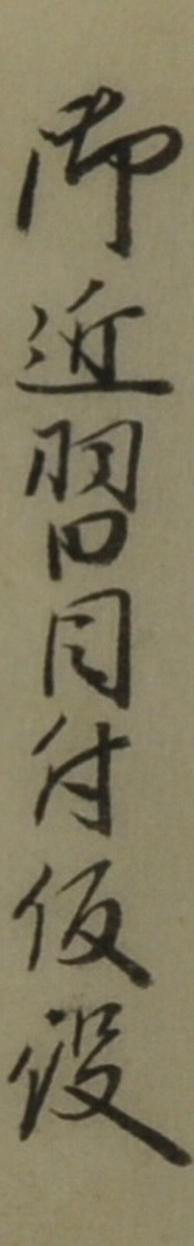御近習目付仮役
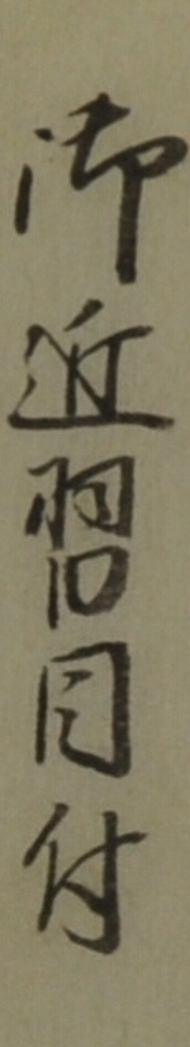御近習目付

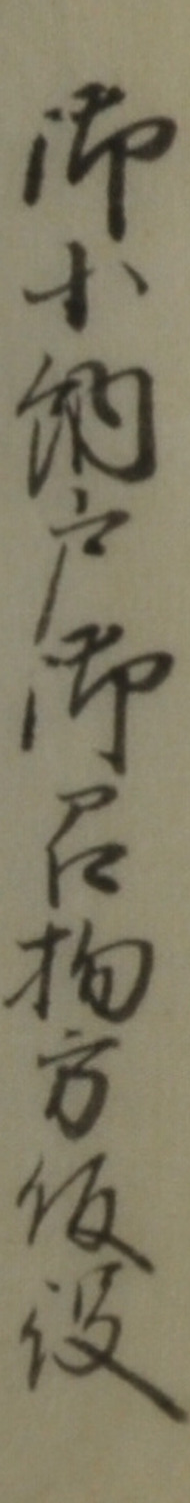御小納戸御召物方仮役
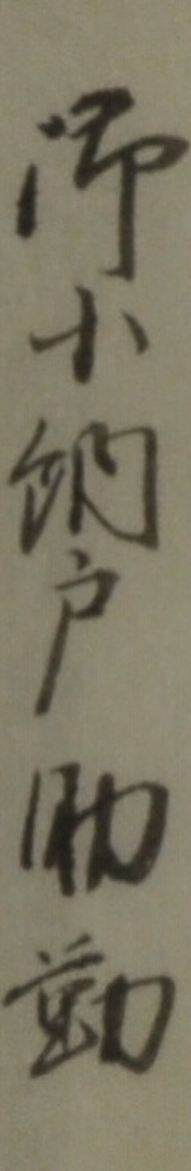御小納戸助勤
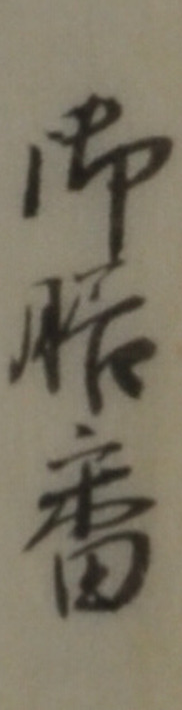御膳番
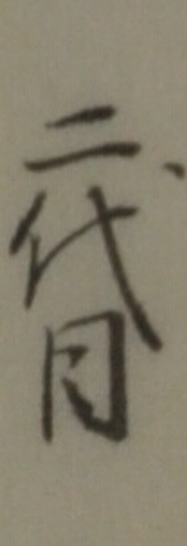二代目
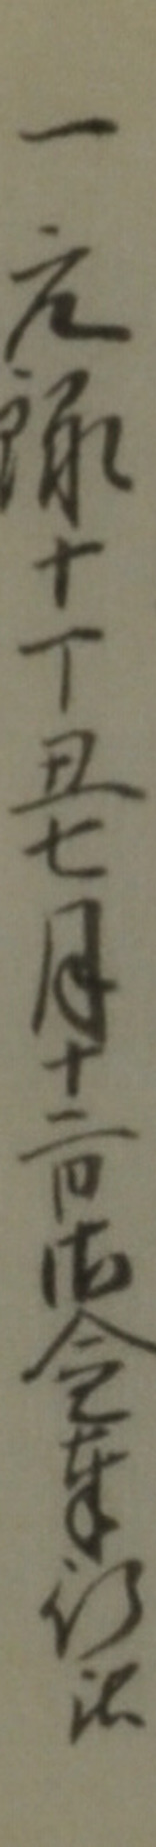一元禄十丁丑七月十二日御金奉行被
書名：諸御役代々録（四）
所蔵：伊那市立高遠町図書館・合同会社AMANE
